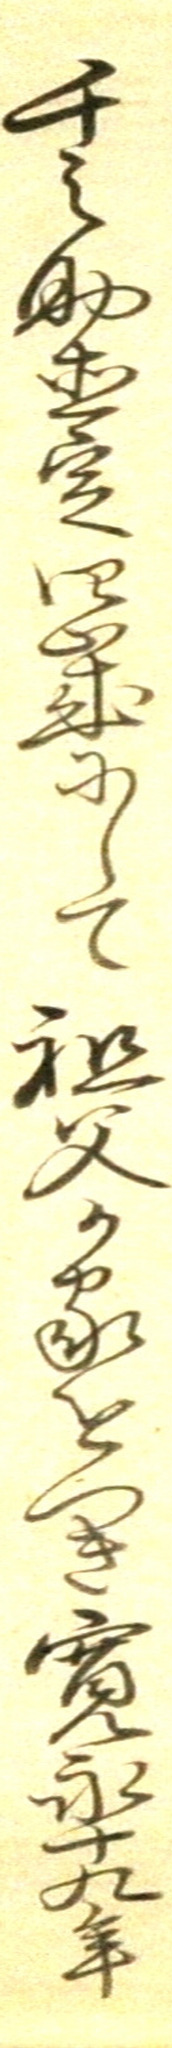千之助直定四歳にして祖父か家をつき寛永十九年
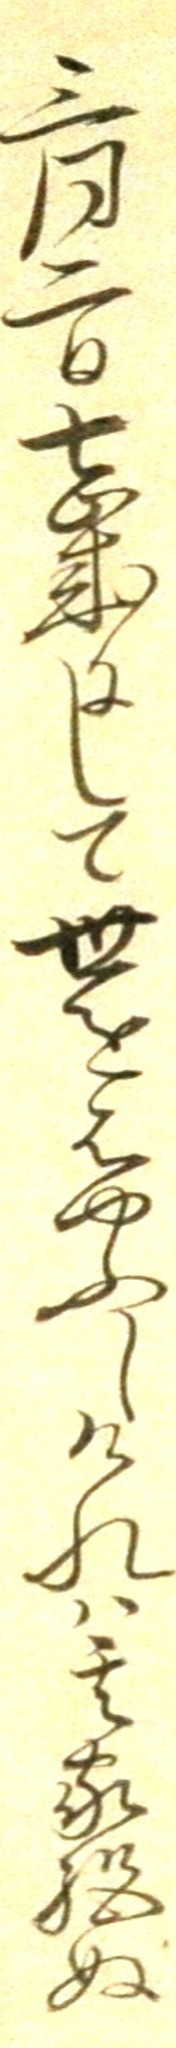三月二日七歳にして世をはやうしけれは其家絶ぬ
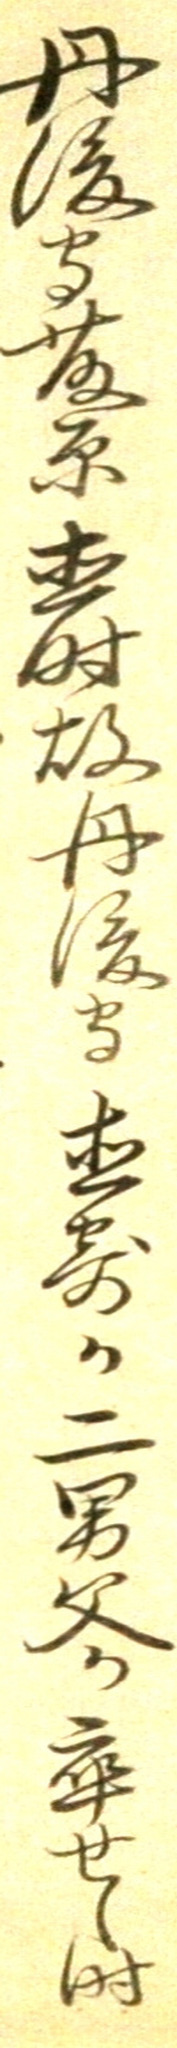丹後守藤原直時故丹後守直寄か二男父か卒せし時

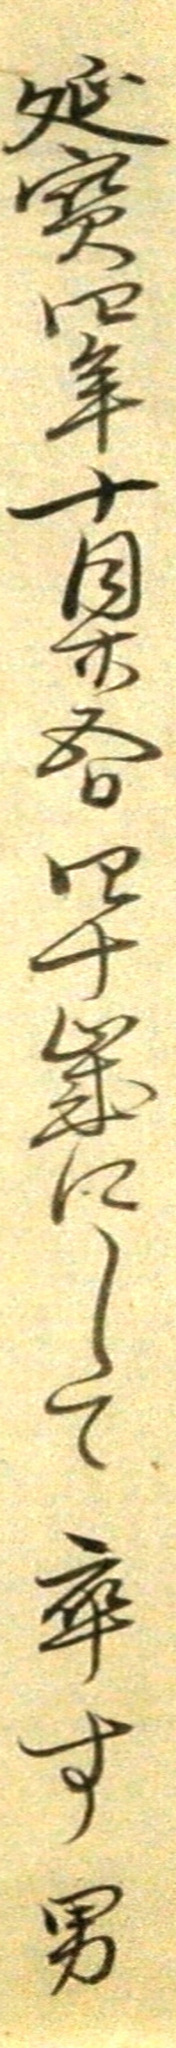延宝四年十月廿五日四十歳にして卒す男
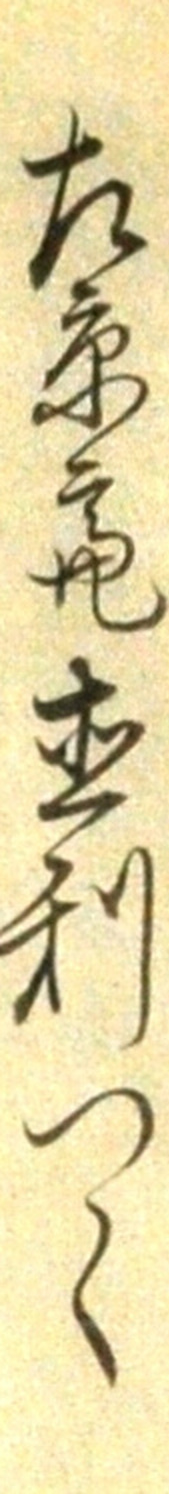左京亮直利つく
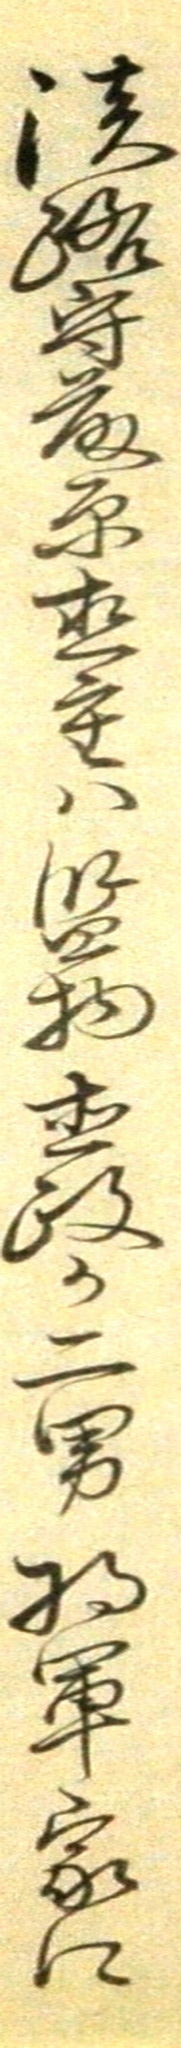淡路守藤原直重は監物直政か二男将軍家に
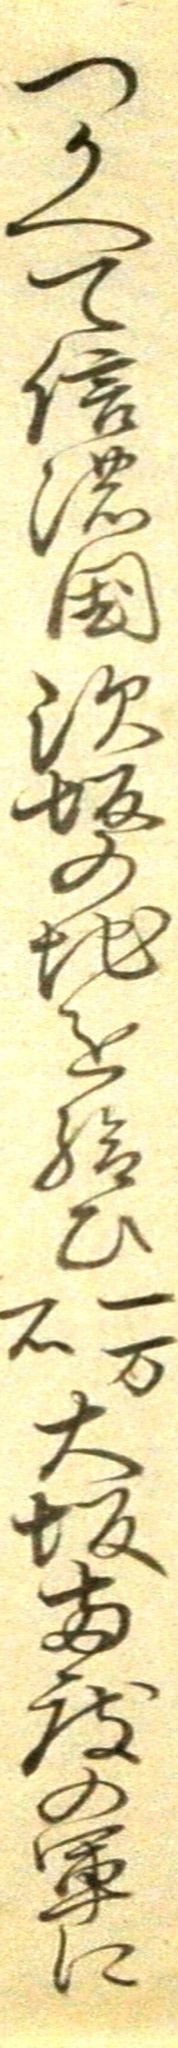つかへて信濃国須坂の地を給ひ一万石大坂両度の軍に
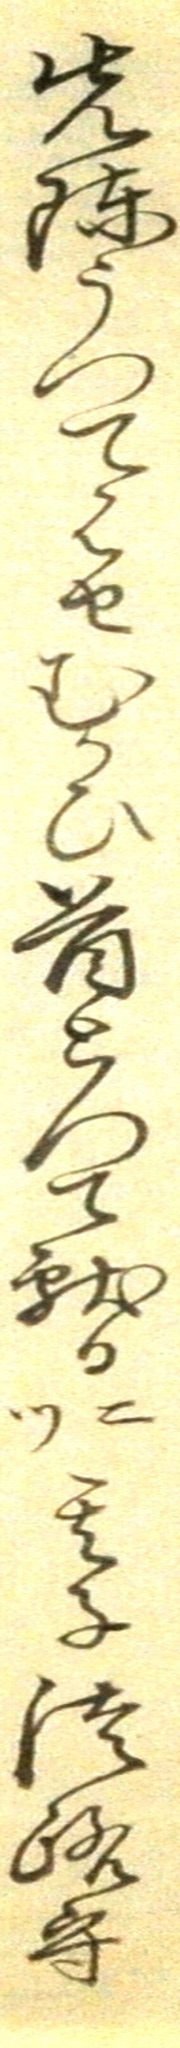先陣うつてはせむかひ首とつて献る二ツ其子淡路守
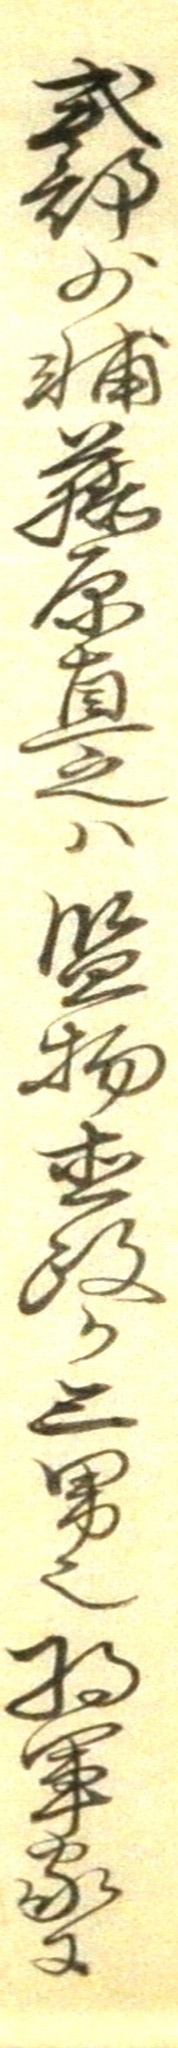式部少輔藤原直之は監物直政か三男也将軍家に
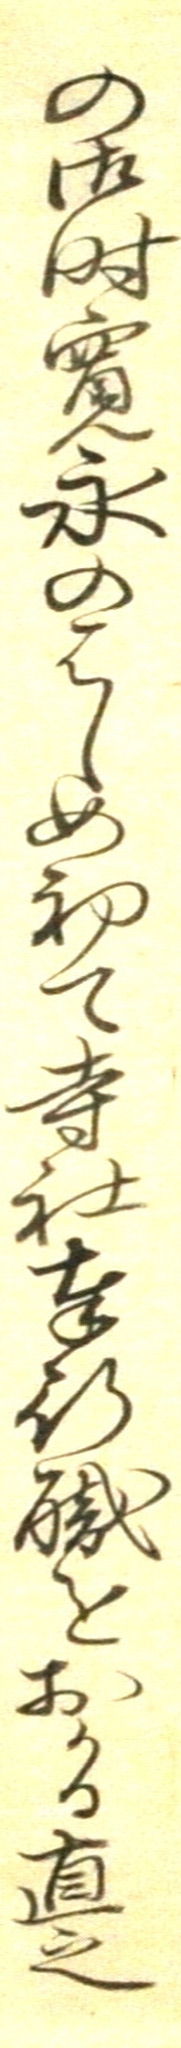の御時寛永のはしめ初て寺社奉行職をおかる直之
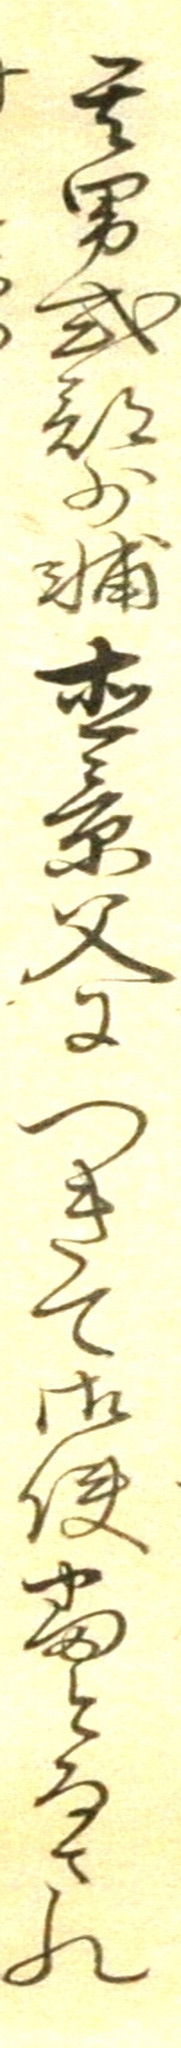其男式部少輔直景父につきて御使番となされ
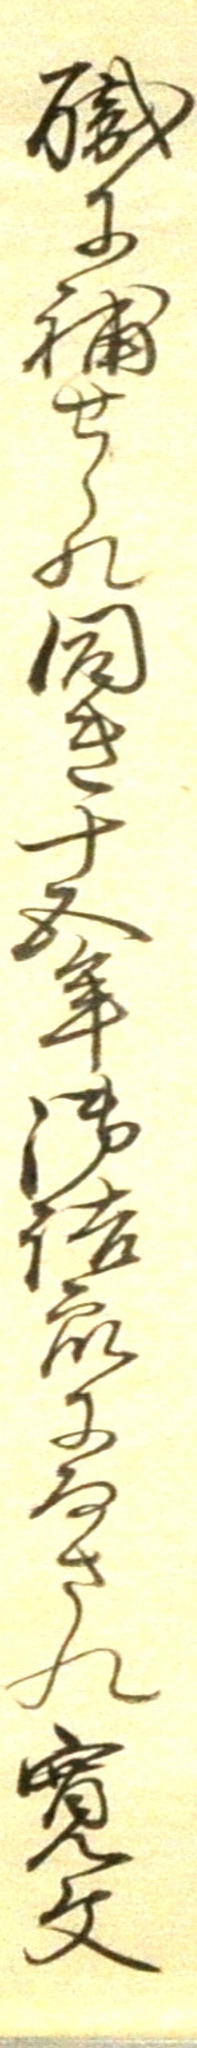職に補せられ同き十五年御詰衆なされ寛文
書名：藩翰譜（七・上）
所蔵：伊那市立高遠町図書館・合同会社AMANE
